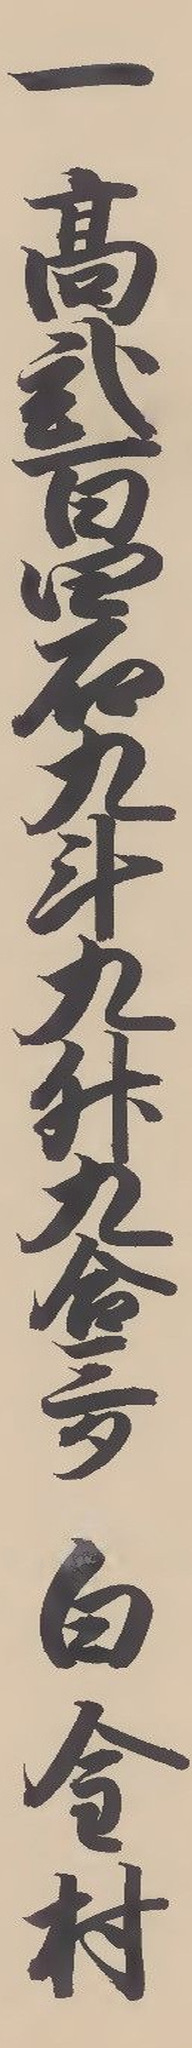一高弐百四石九斗九升九合三勺白金村
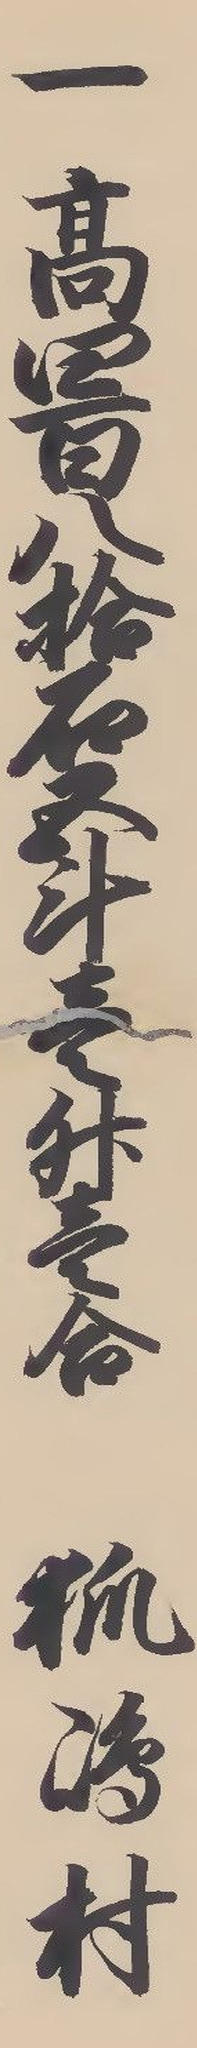一高四百八拾石五斗壱升壱合狐島村

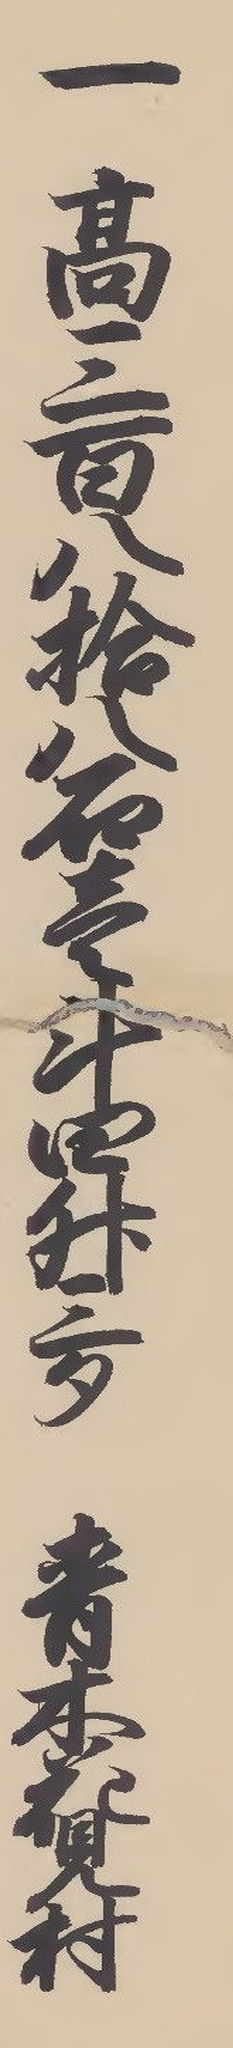一高三百八拾八石壱斗四升三勺青木花見村
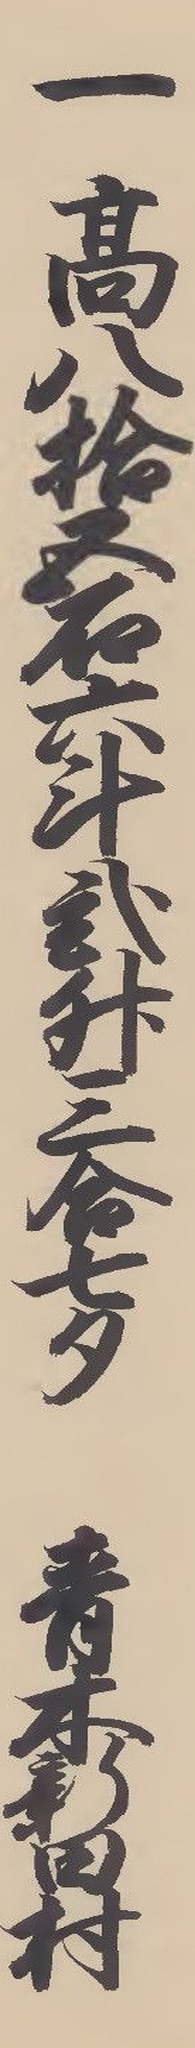一高八拾五石六斗弐升三合七勺青木新田
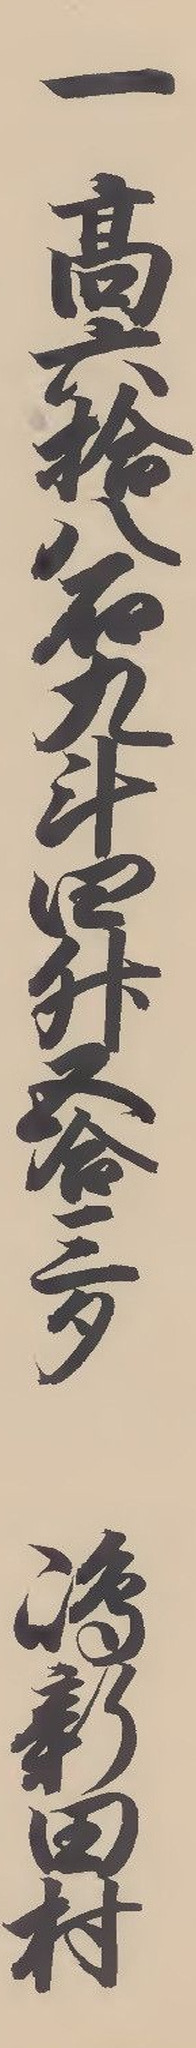一高六拾八石九斗四升五合三勺島新田村
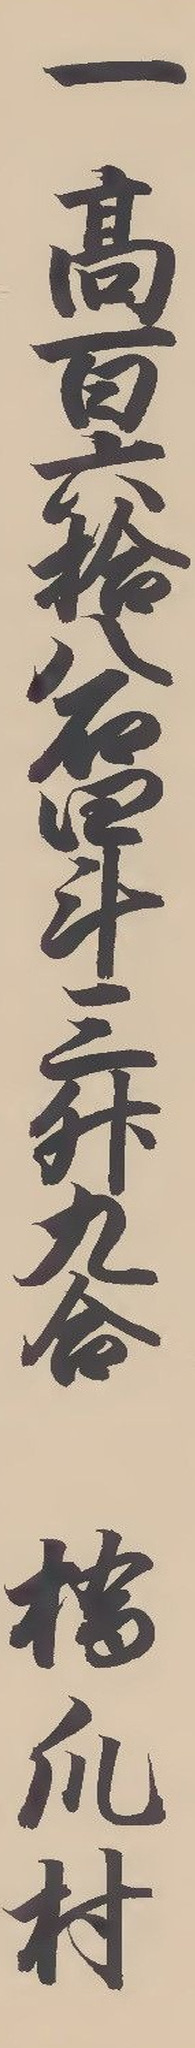一高百六拾八石四斗三升九合橋爪村
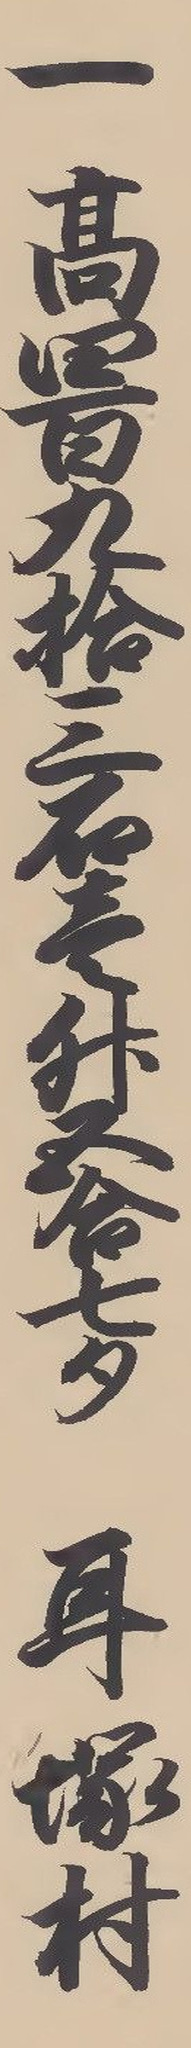一高四百九拾三石壱升五合七勺耳塚村
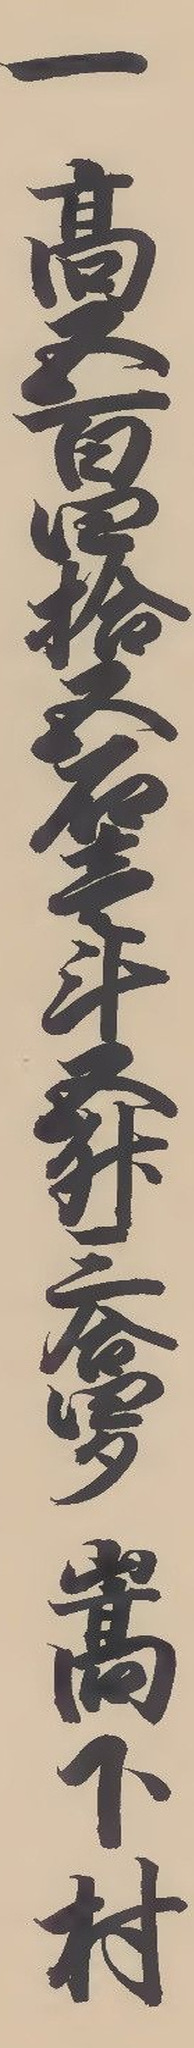一高五百四拾五石壱斗五升三合四勺嵩下村
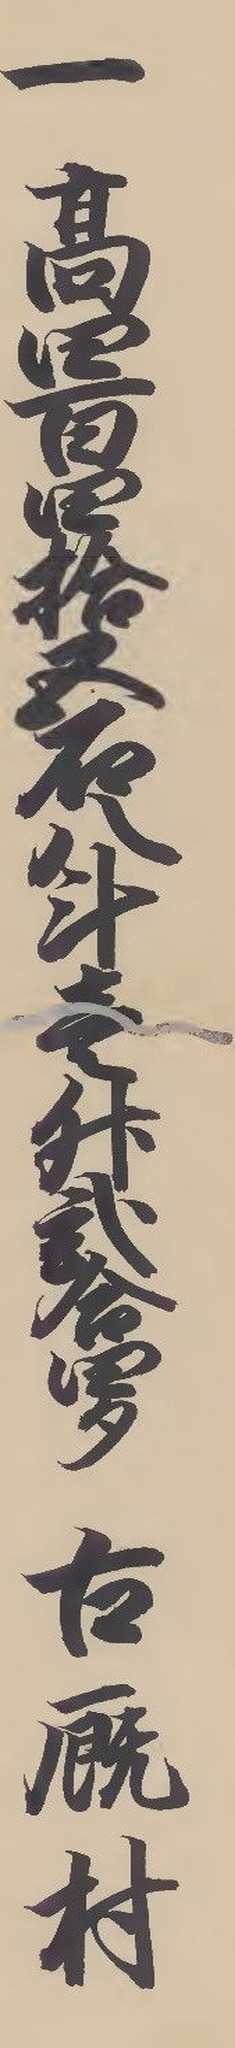一高四百四拾五石八斗壱升弐合四勺古厩村

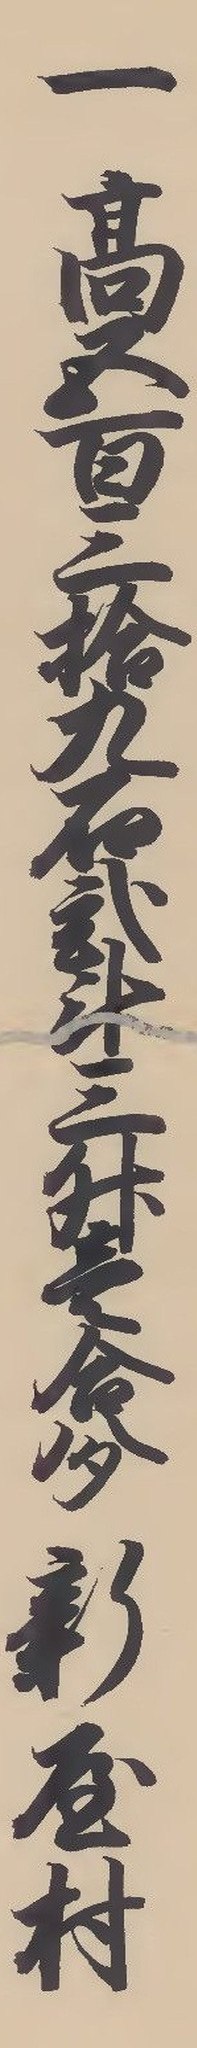一高五百三拾九石弐斗三升壱合八勺新屋村
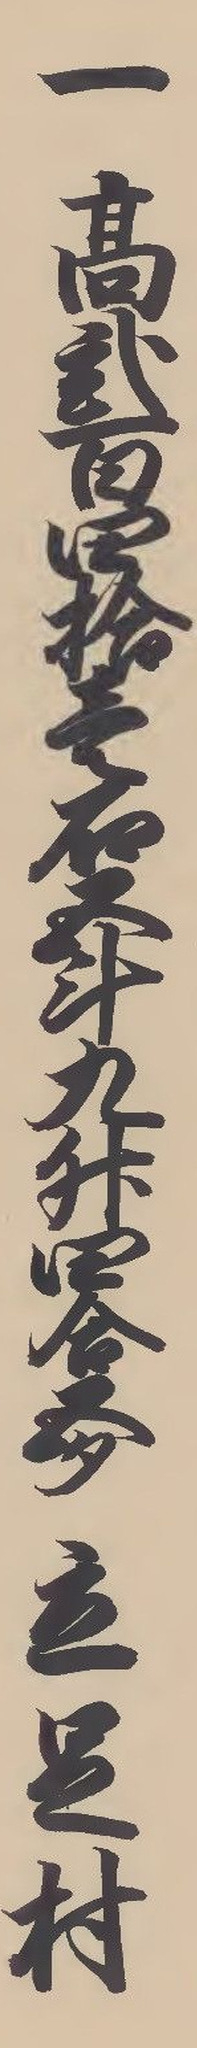一高弐百四拾壱石五斗九升四合五勺立足村
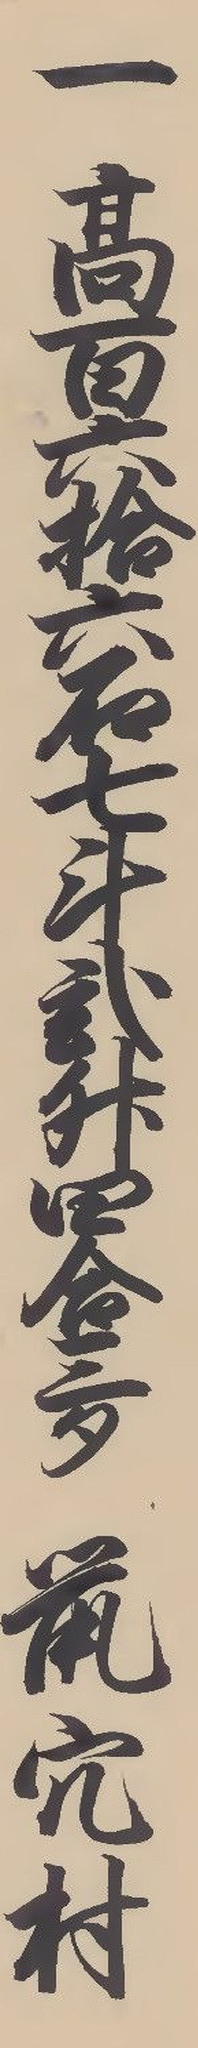一高百六拾六石七斗弐升四合三勺鼠穴村
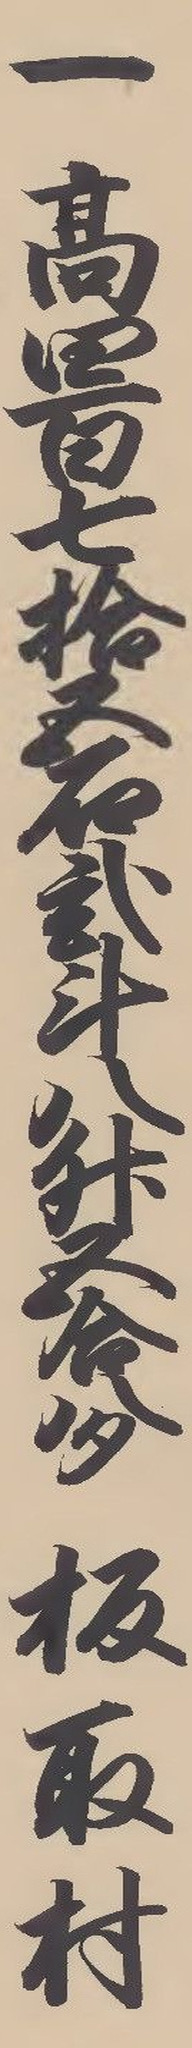一高四百七拾五石弐斗八升五合八勺板取村
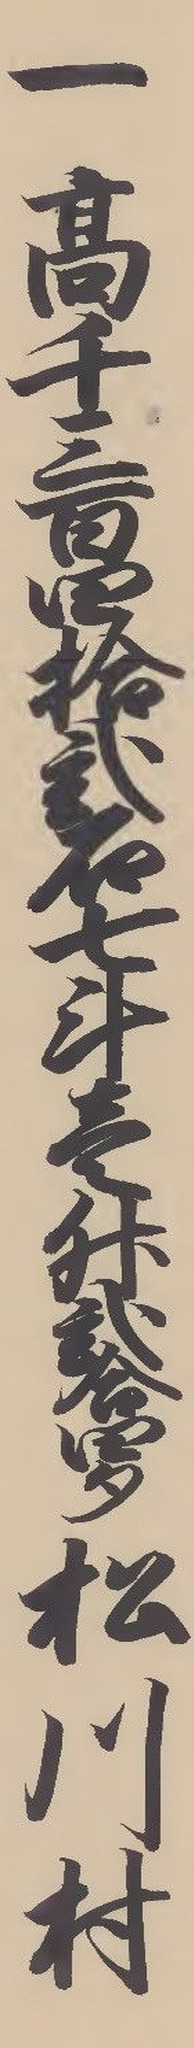一高千三百四拾弐石七斗壱升弐合四勺松川村
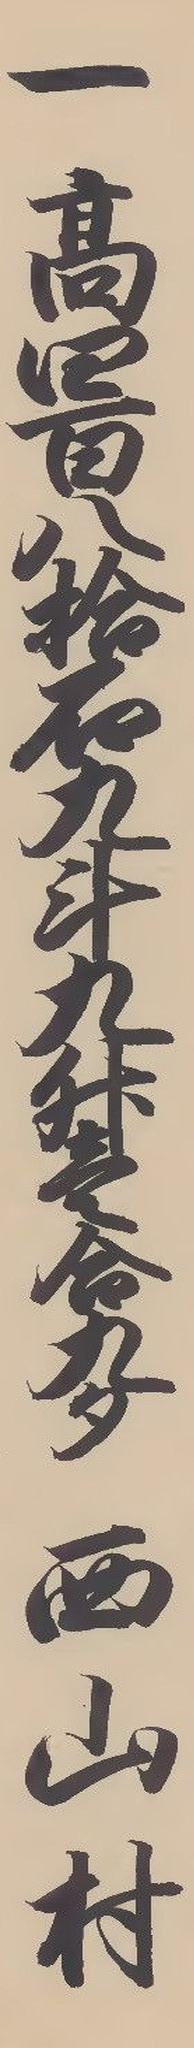一高四百八拾石九斗九升壱合九勺西山村
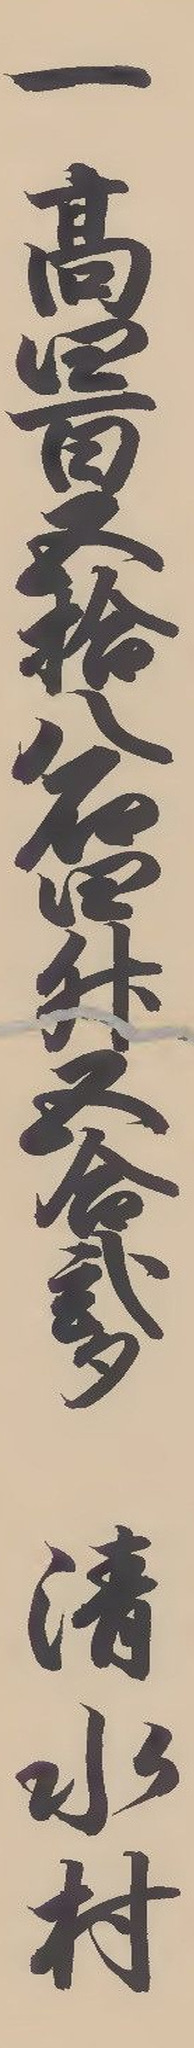一高四百五拾八石四升五合弐勺清水村
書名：信濃国郷帳
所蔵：国立公文書館 National Archives of Japan
